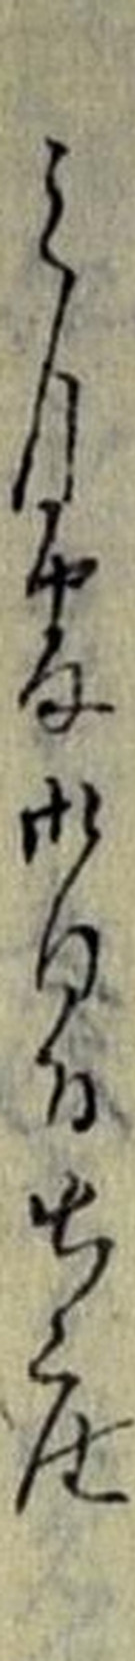之月番御目付出座
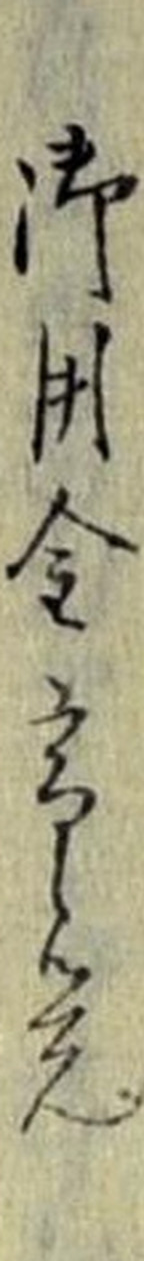御用金高之覚
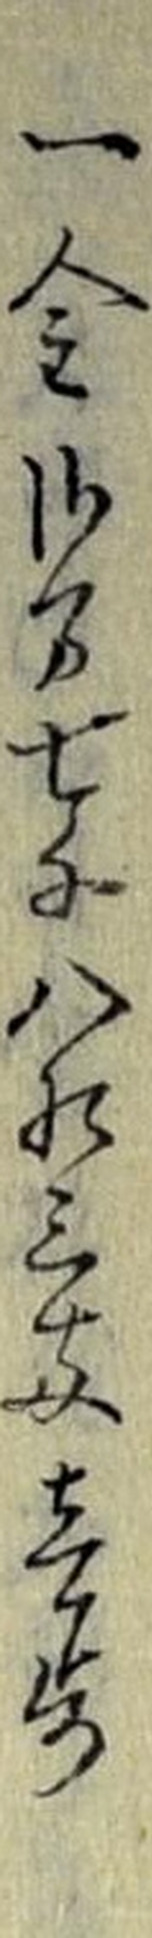一金弐万七千八拾三両壱歩町方
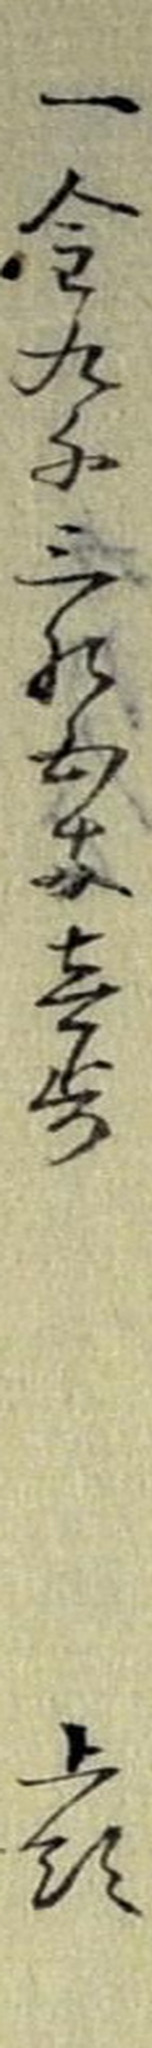一金九千三拾五両壱歩上領
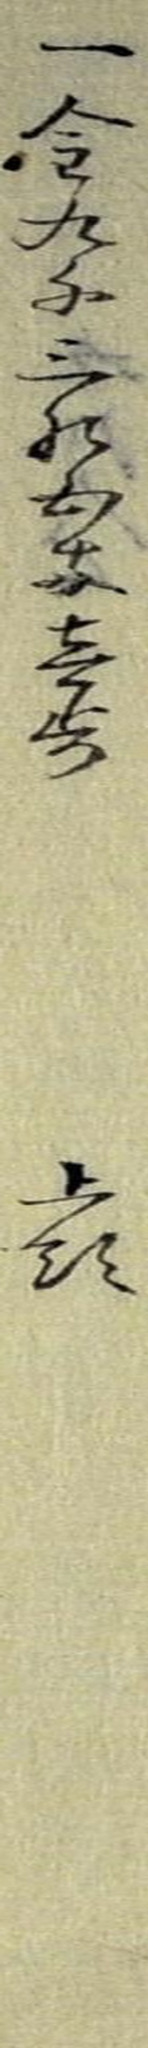一金九千三拾五両壱歩上領
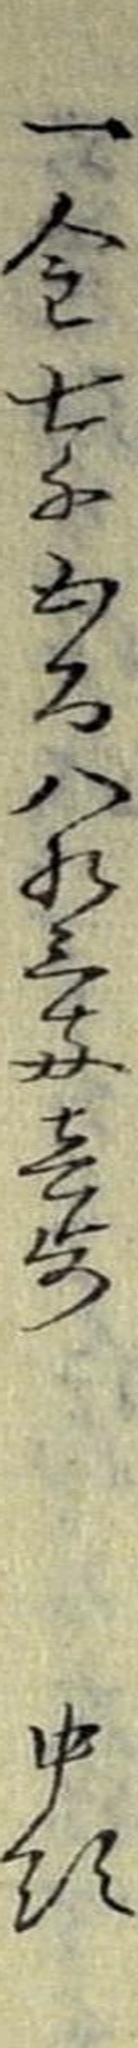一金七千五百八拾三両壱歩中領
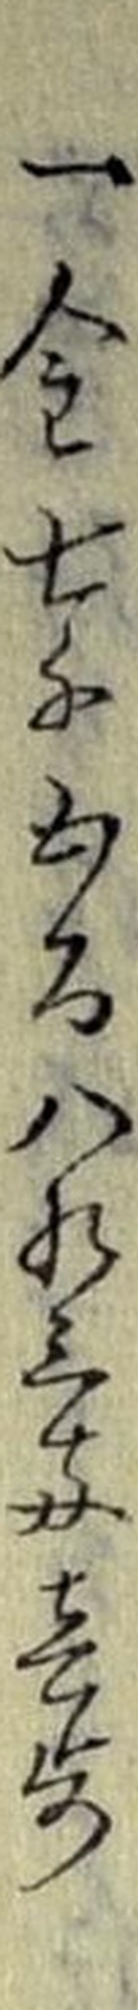一金七千五百八拾三両壱歩中領
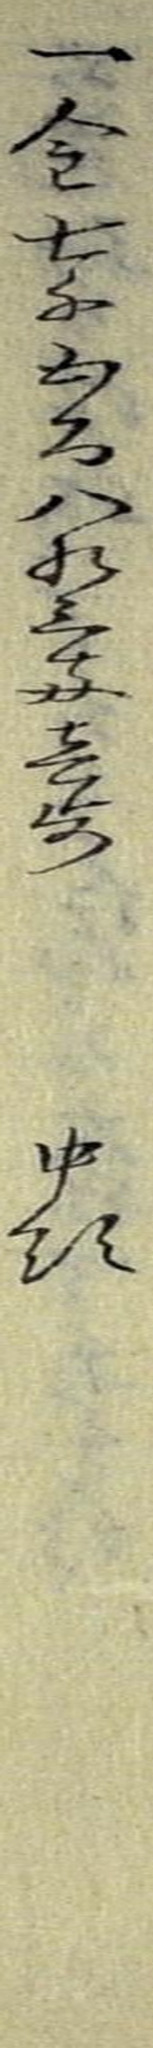一金七千五百八拾三両壱歩中領
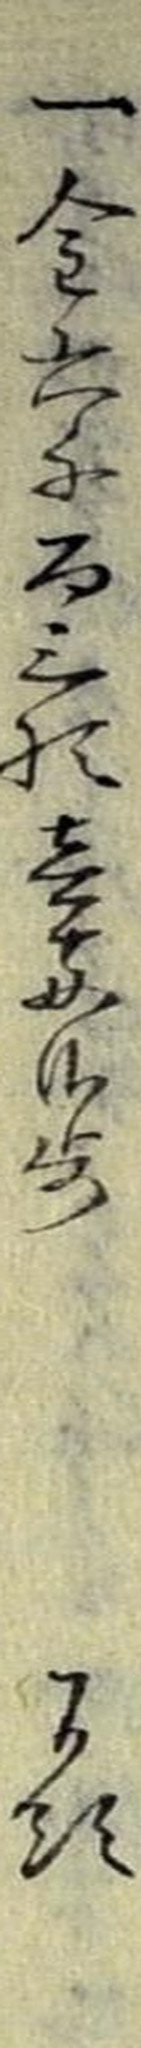一金六千百三拾壱両弐歩下領
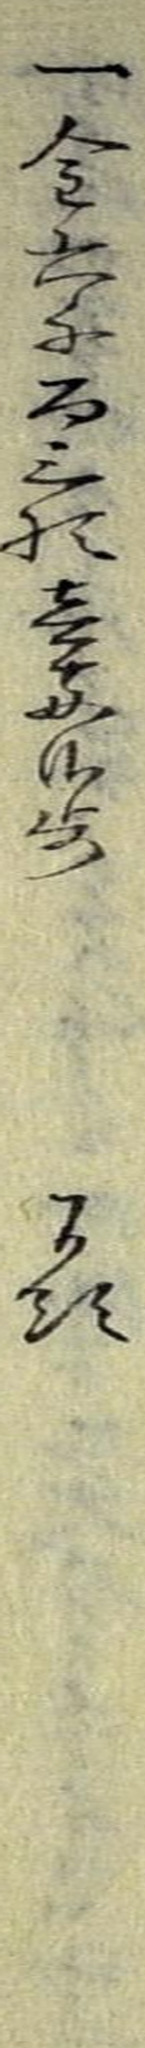一金六千百三拾壱両弐歩下領
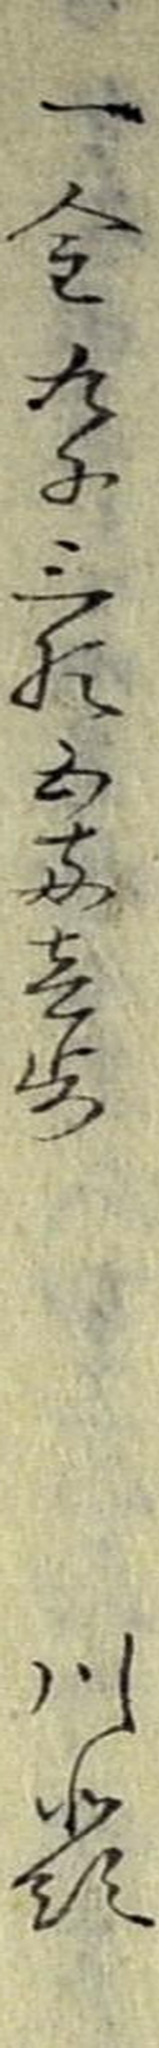一金九千三拾五両壱歩川北領
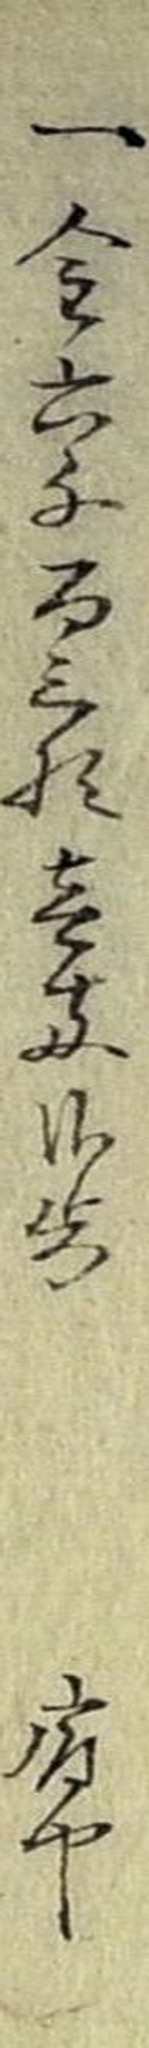一金六千百三拾壱両弐歩府中
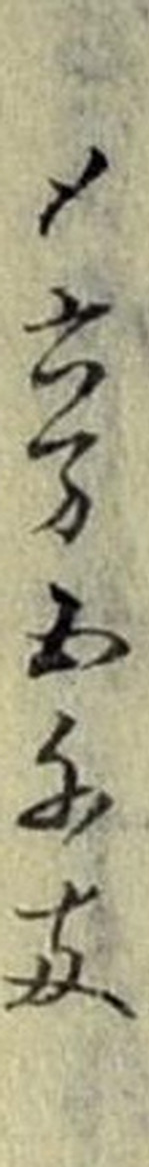〆六万五千両
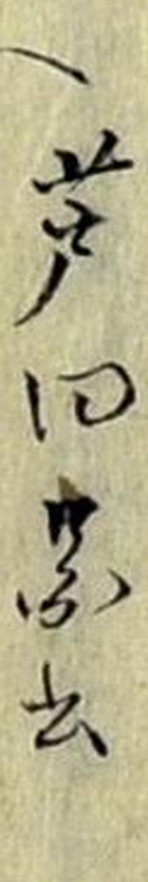芦田図書
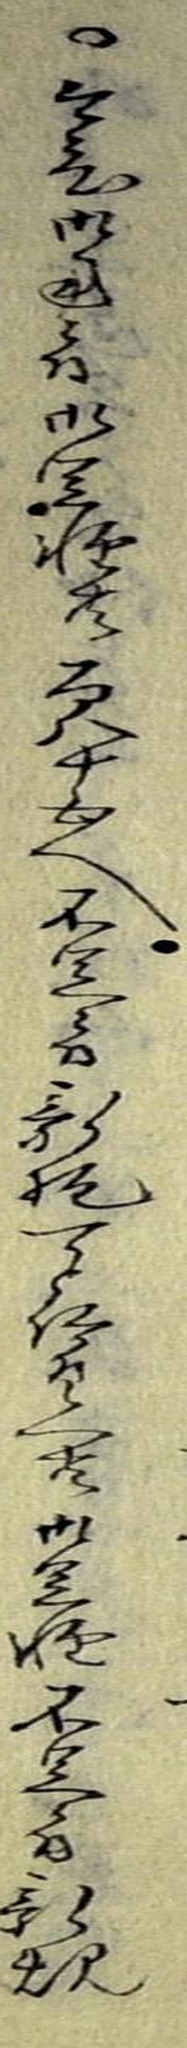〇今度御用ニ付御足軽共百八十五人不足ニ付新抱可被仰付候へ共御足軽不足ニ付新規
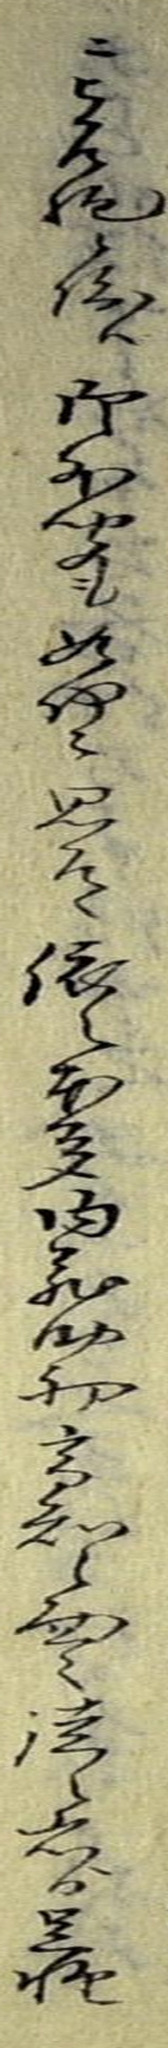ニ被召抱候儀ハ御外聞も如何ニ思召候依之本多内蔵助高知之面々徒之者ゟ足軽
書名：命令之部 一
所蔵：福井県文書館 Fukui Prefectural Archives
